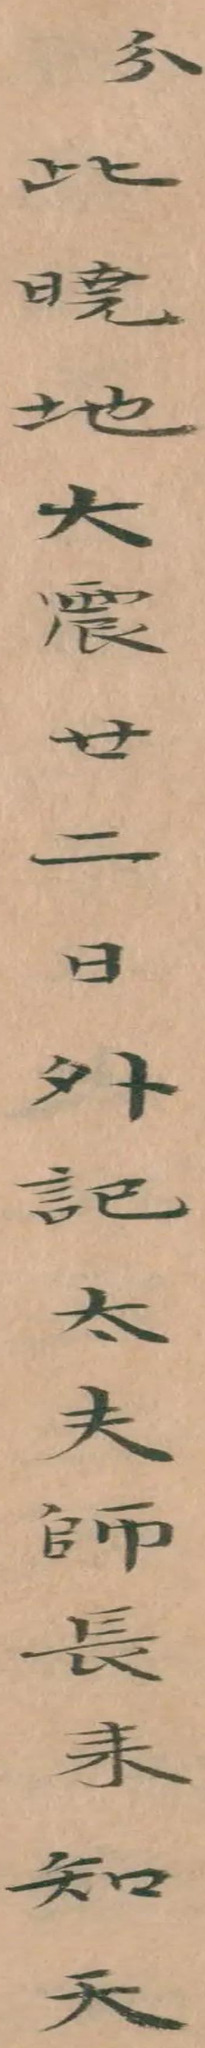分此暁地大震廿二日外記太夫師長来知天
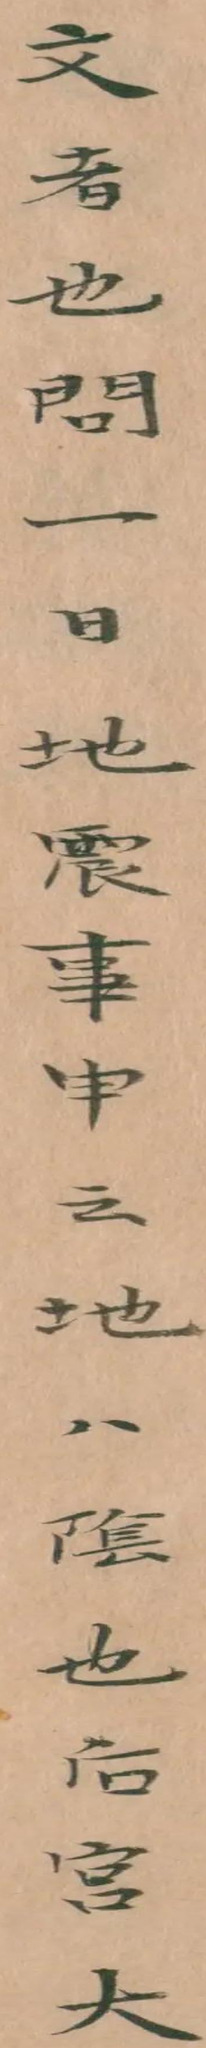文者也問一日地震事申云地ハ陰也后宮大
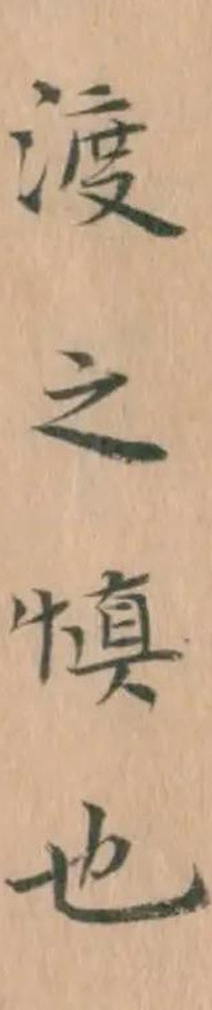渡之慎也

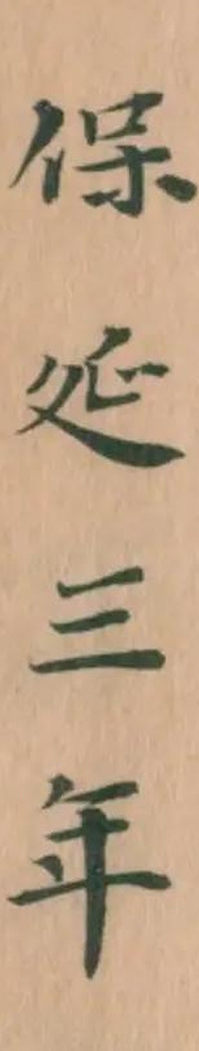保延三年
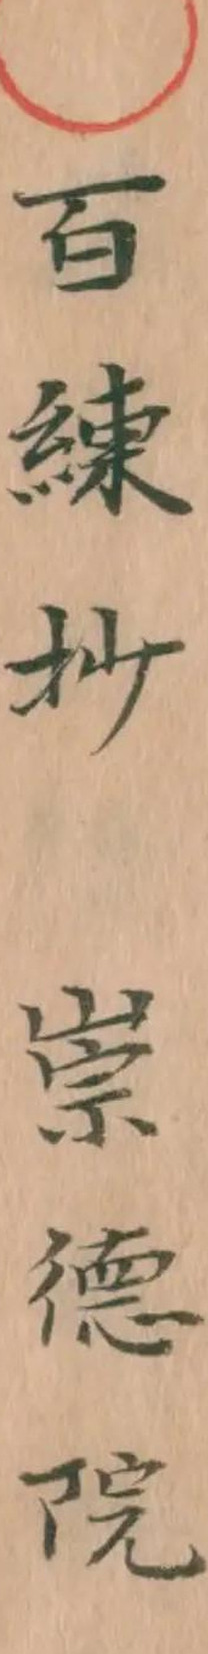○百練抄崇徳院
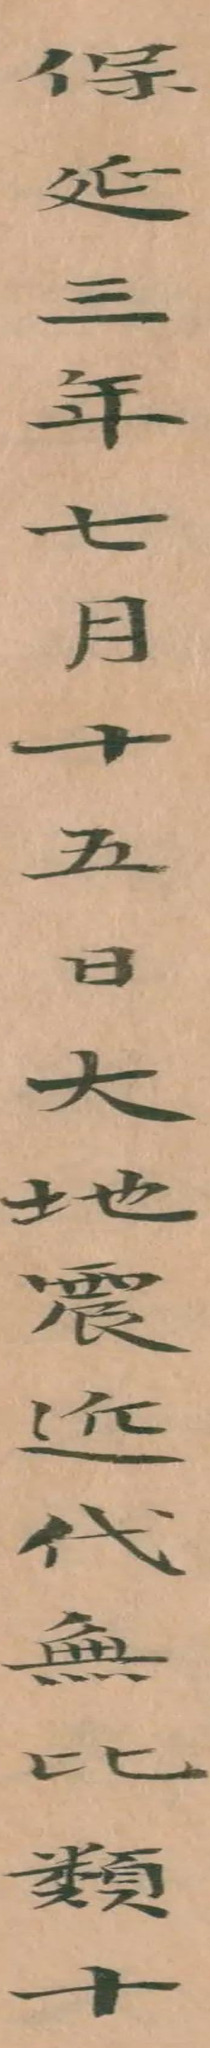保延三年七月十五日大地震近代無比類十
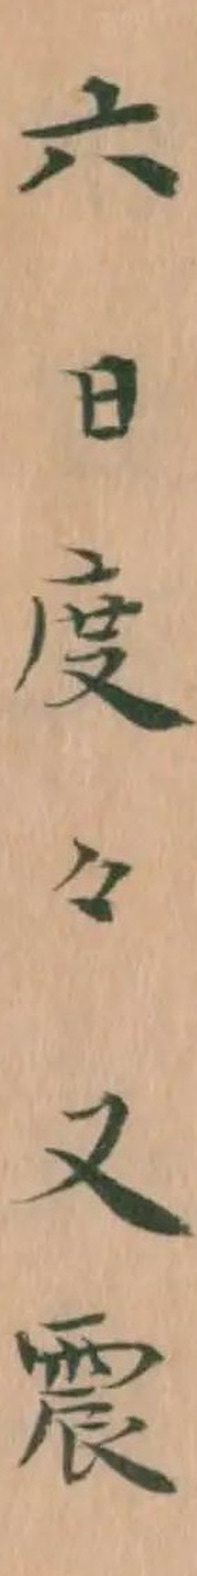六日度々又震
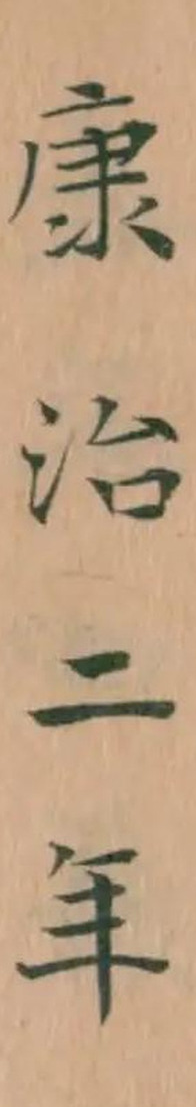康治二年
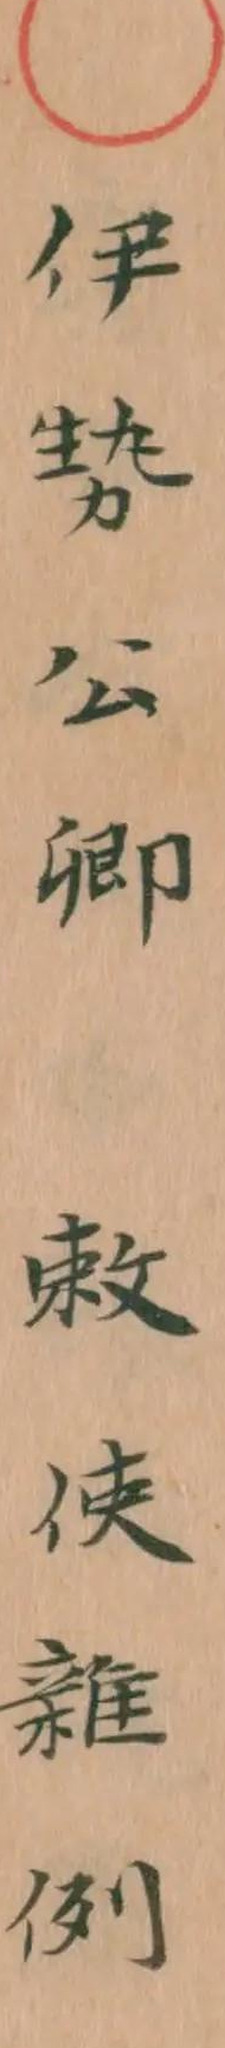○伊勢公卿敇使雑例
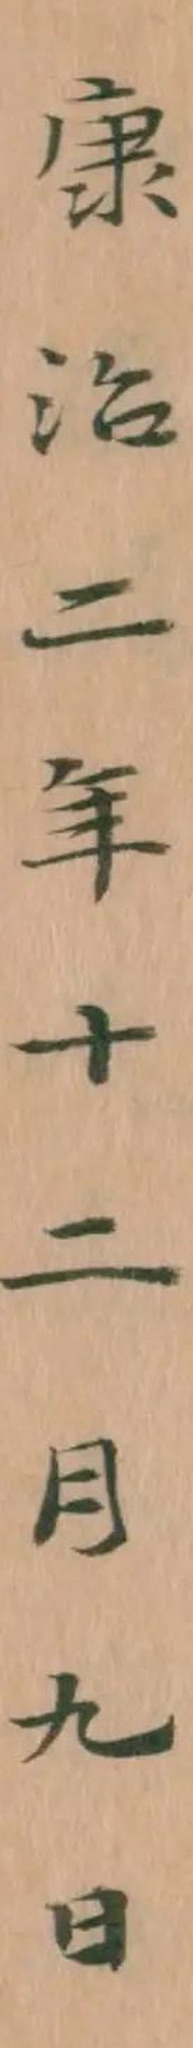康治二年十二月九日
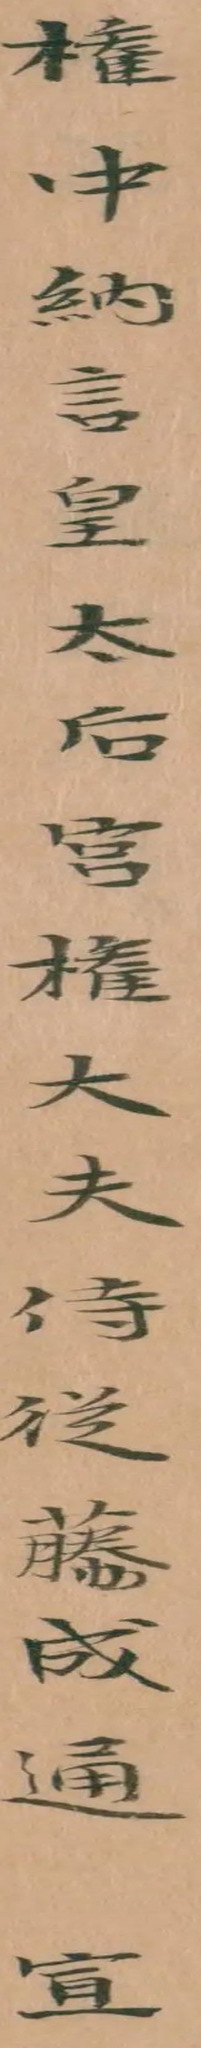権中納言皇太后権大夫侍従藤成通宣
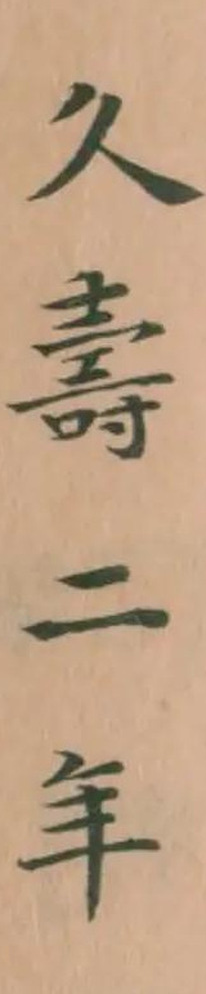久寿二年
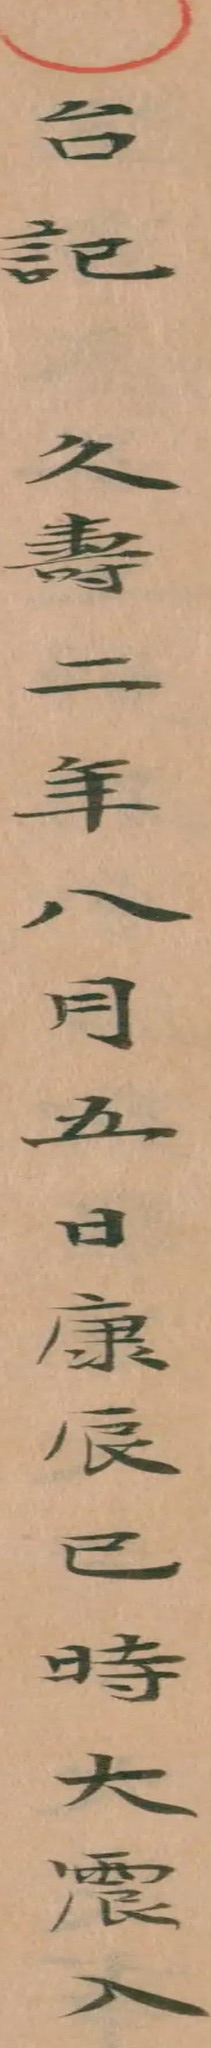○台記久寿二年八月五日康辰巳時大震入
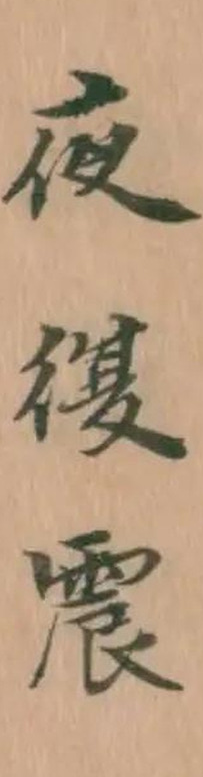夜復震
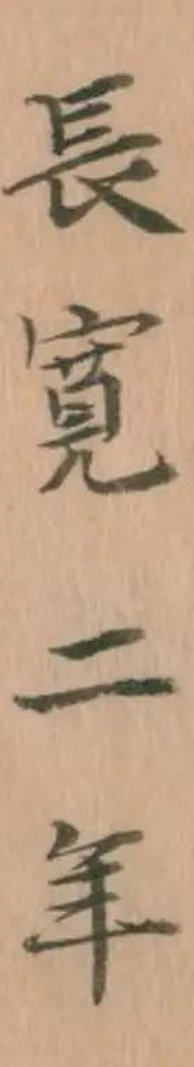長寛二年
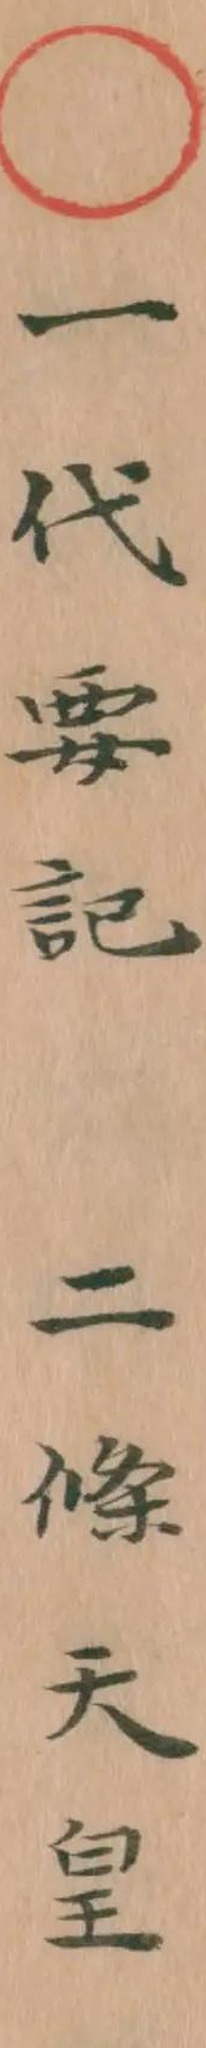○一代要記二条天皇
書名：地災撮要. 巻5-6(地震之部)
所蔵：国立国会図書館 National Diet Library, JAPAN
